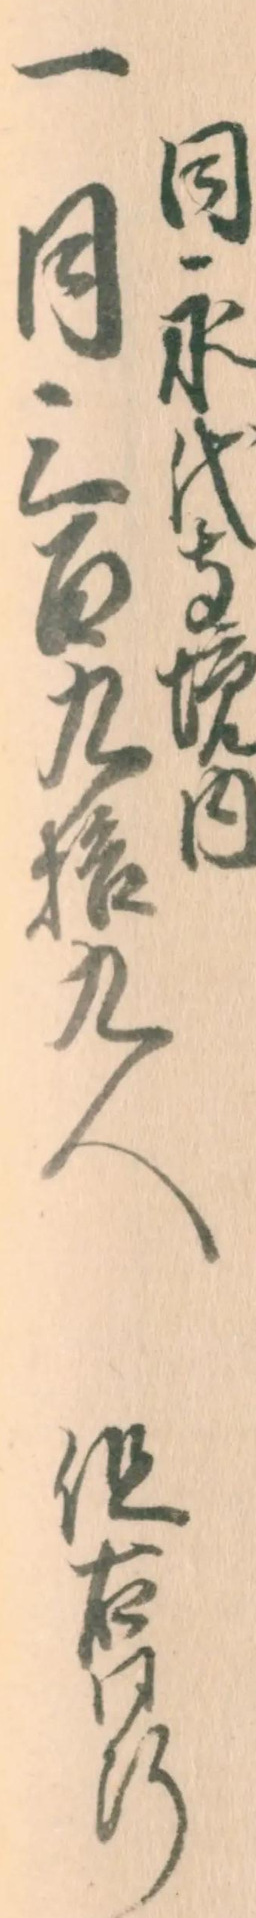一同三百九十九人但右同断
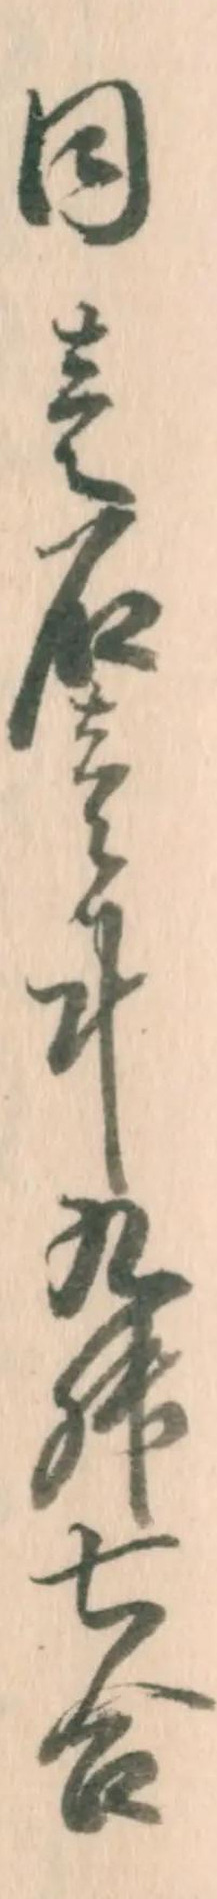同壱石壱斗九升七合
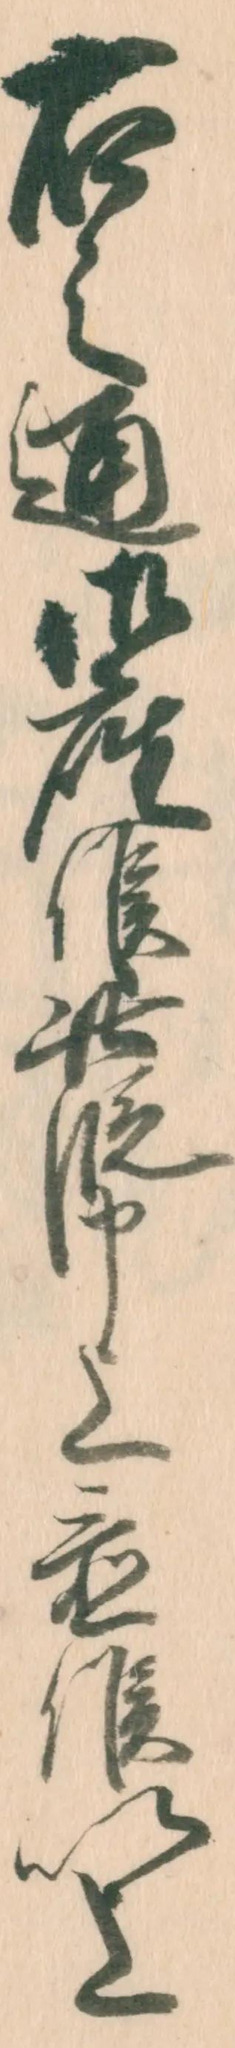右之通御座候此段申上置候以上
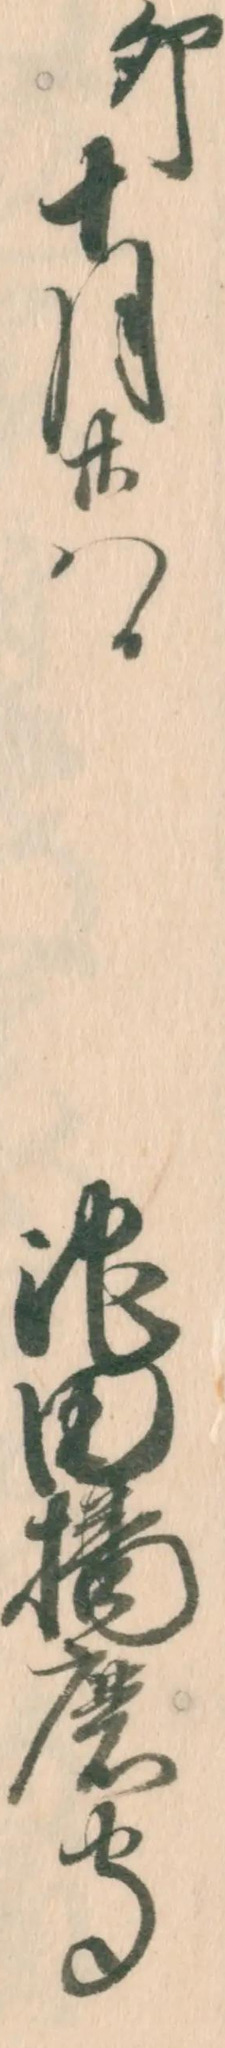卯十月廿八日池田播磨守

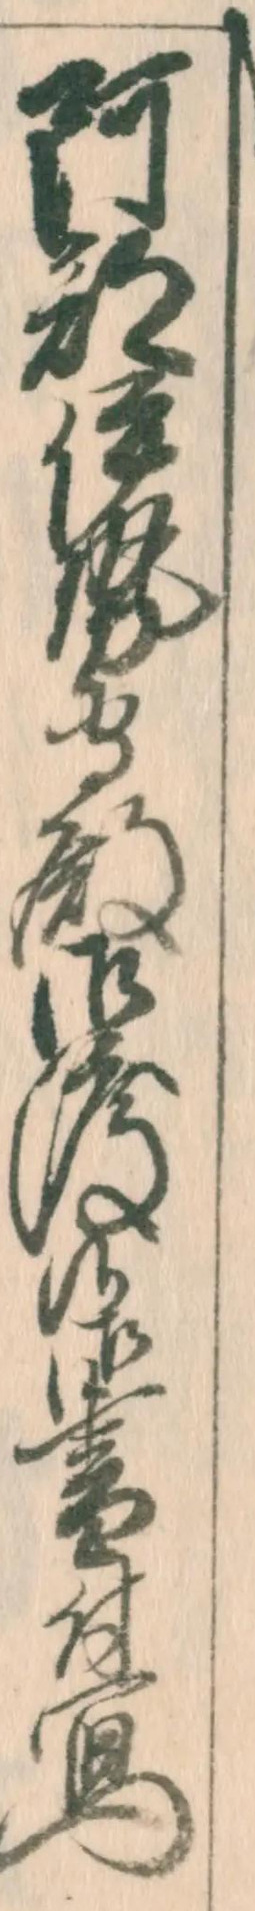│阿部伊勢守殿御渡候御書付写
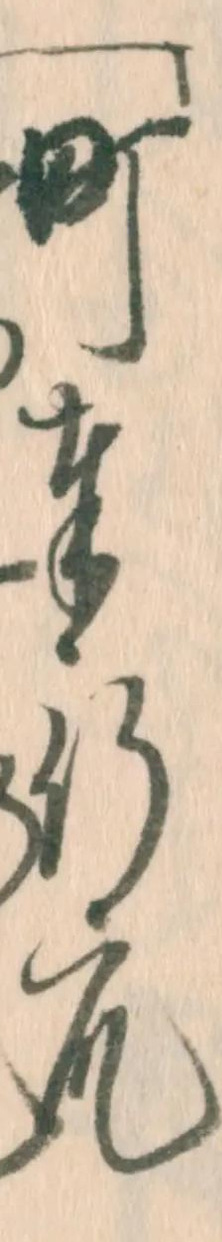││町奉行衆
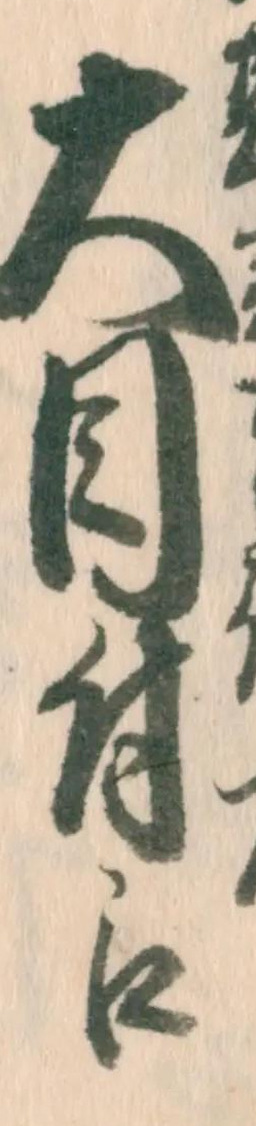│大目付え
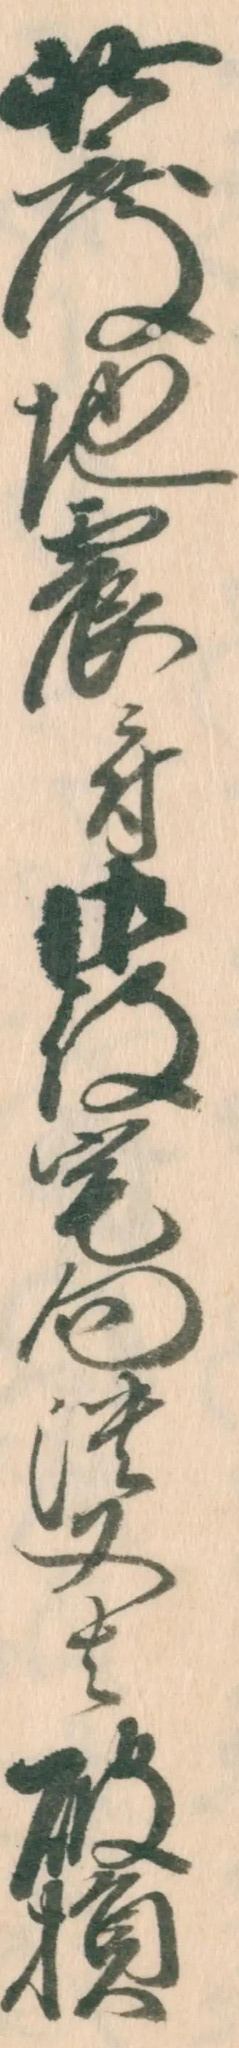此度地震ニ付御役宅向潰又は破損
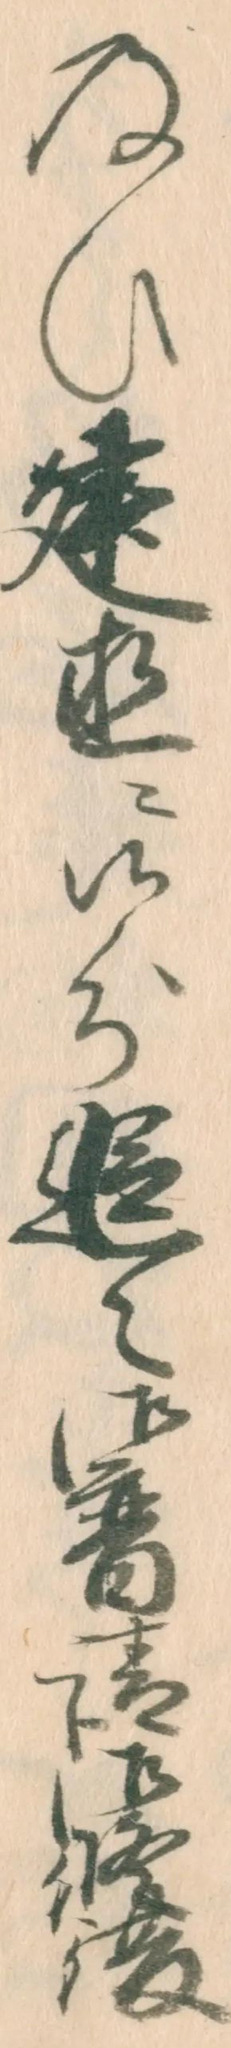及ひ建直ニ候分追〻御普請御修復

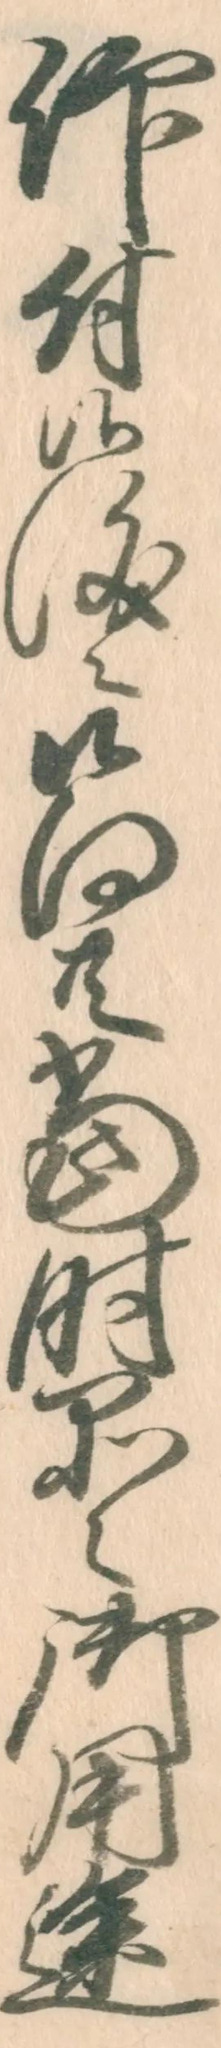仰付候儀ニ候得共当時早〻御用達
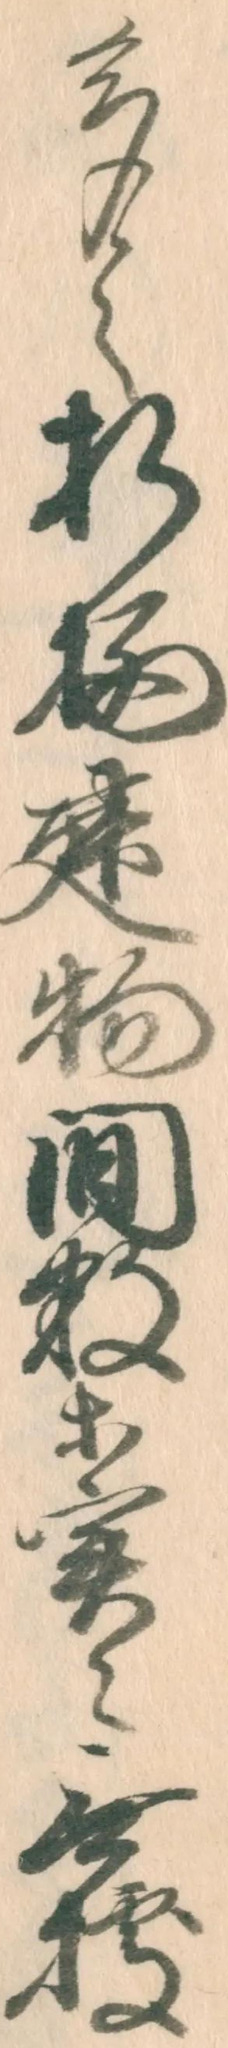多之折柄建物間数等実〻無拠
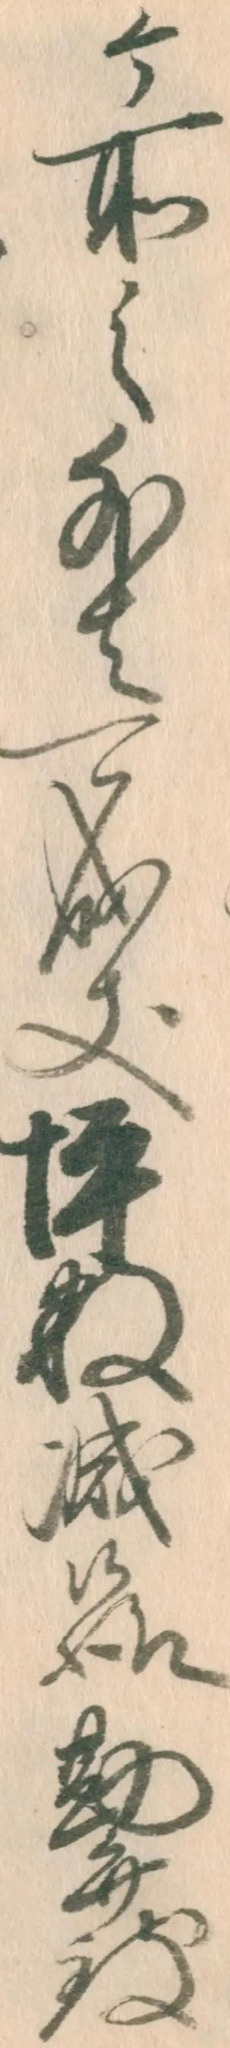ケ所之外は可成丈坪数減候様勘弁致
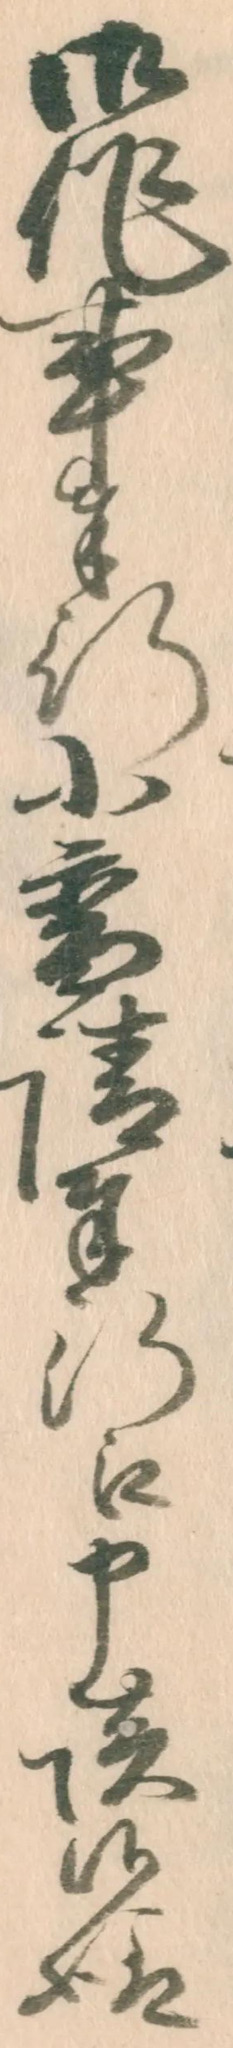御作事奉行小普請奉行え申談候様
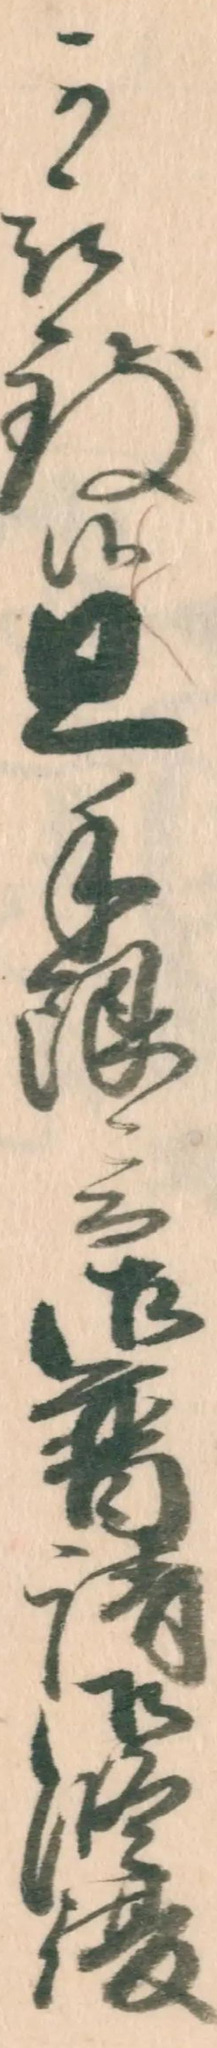可被致候且手限ニて御普請御修復
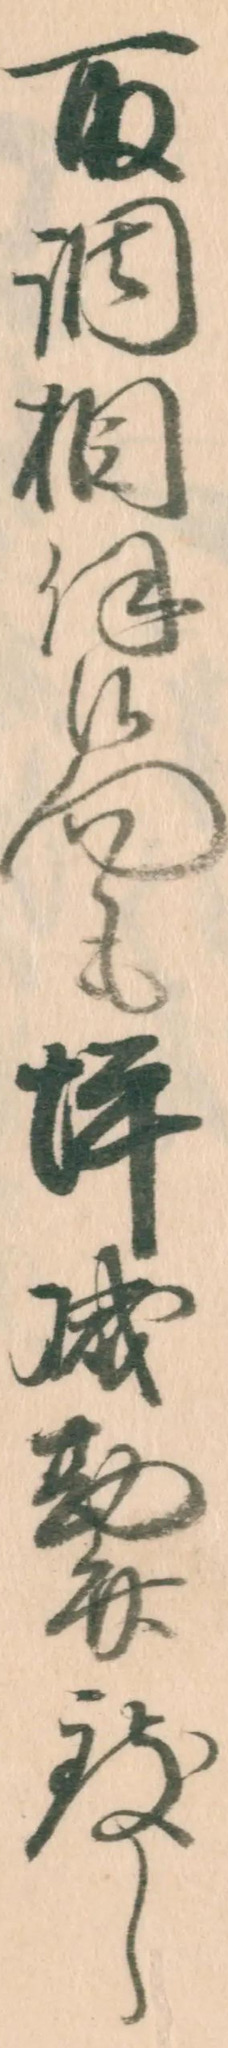取調相伺候向も坪減勘弁致し
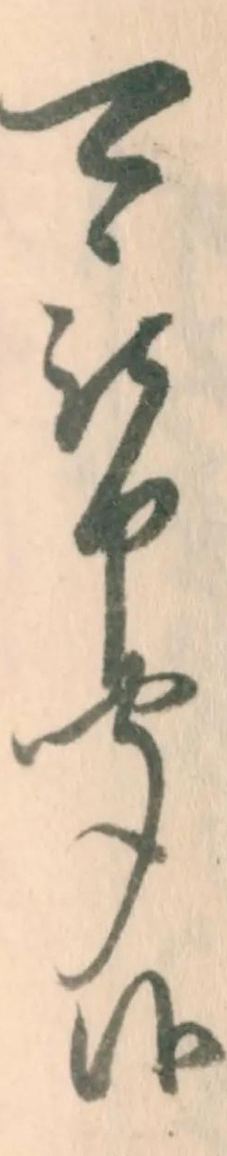可被申聞候
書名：地震災書留 2巻. [2] 内表紙に「地震一件　安政二卯年十月」とあり
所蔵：国立国会図書館 National Diet Library, JAPAN
